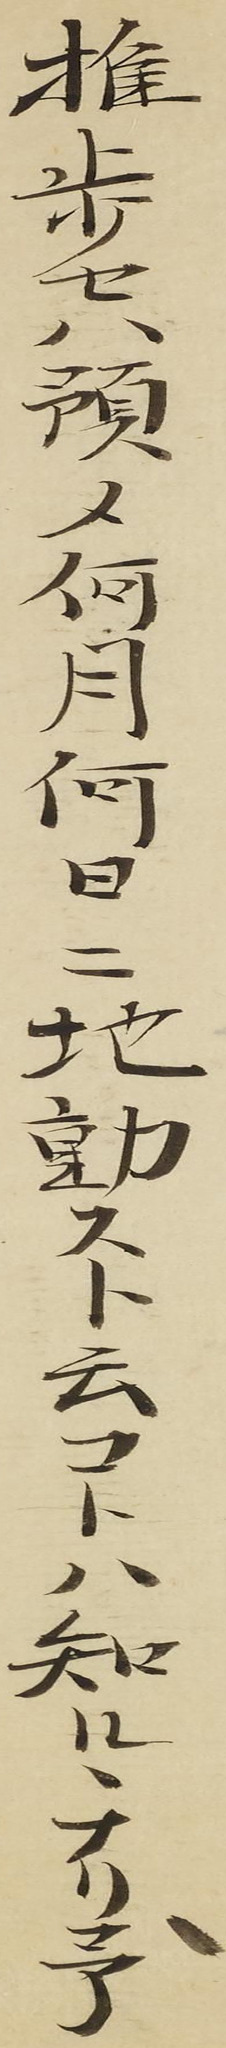推歩セハ預メ何月何日ニ地動スト云コトハ知ルヽナリ、予
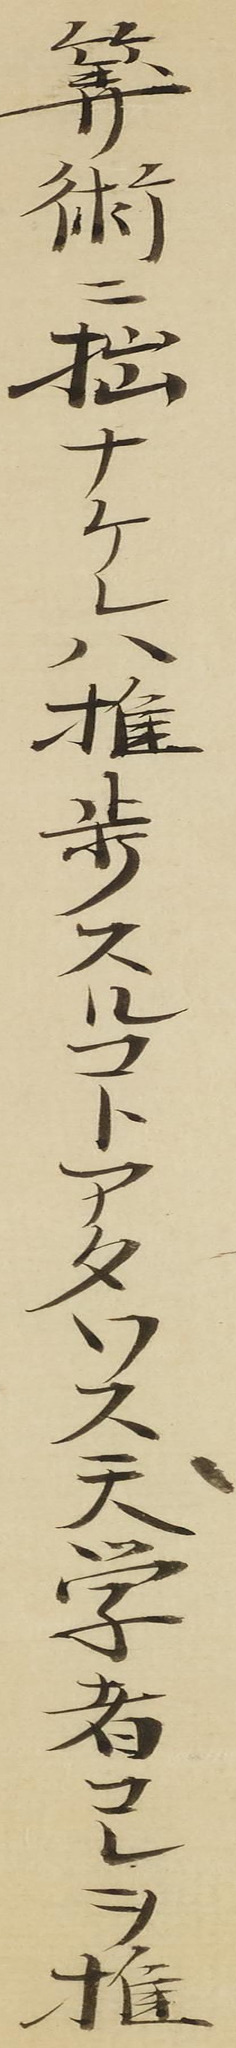算術ニ拙ナケレハ推歩スルコトアタワス、天学者コレヲ推
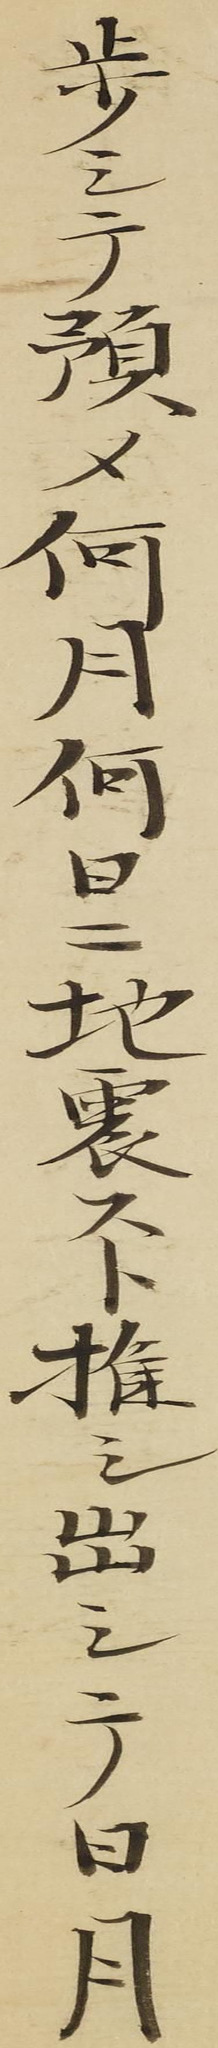歩シテ預メ何月何日ニ地震スト推シ出シテ日月
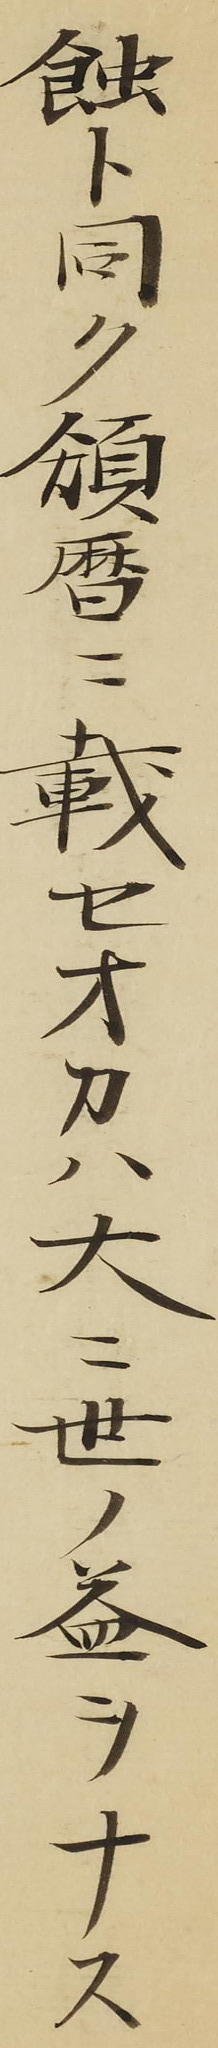蝕ト同ク領暦ニ載セオカハ大ニ世ノ益ヲナス
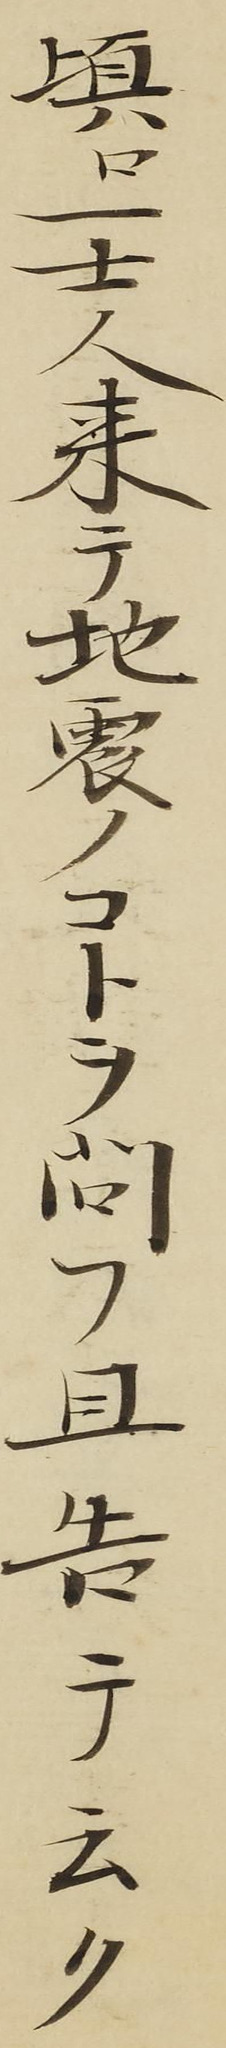頃ロ一士来テ地震ノコトヲ問フ且告テ云ク
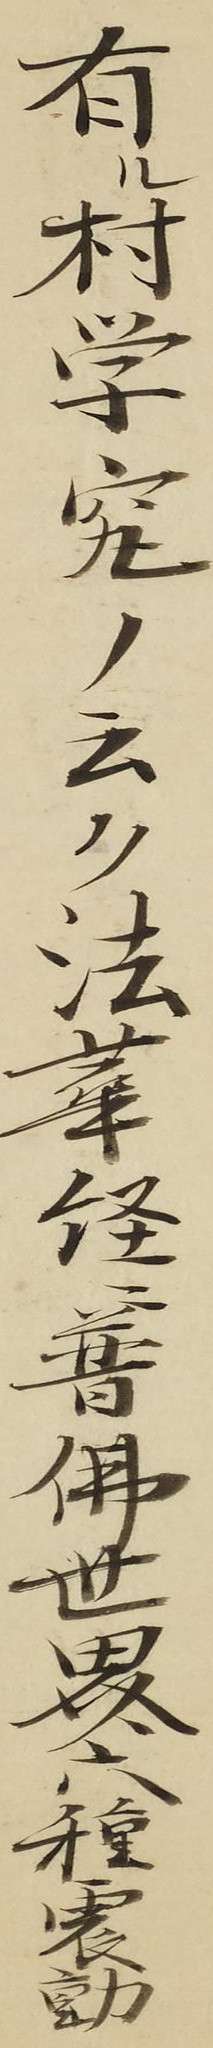有ル村学究ノ云ク法華経ニ普仏世界六種震動
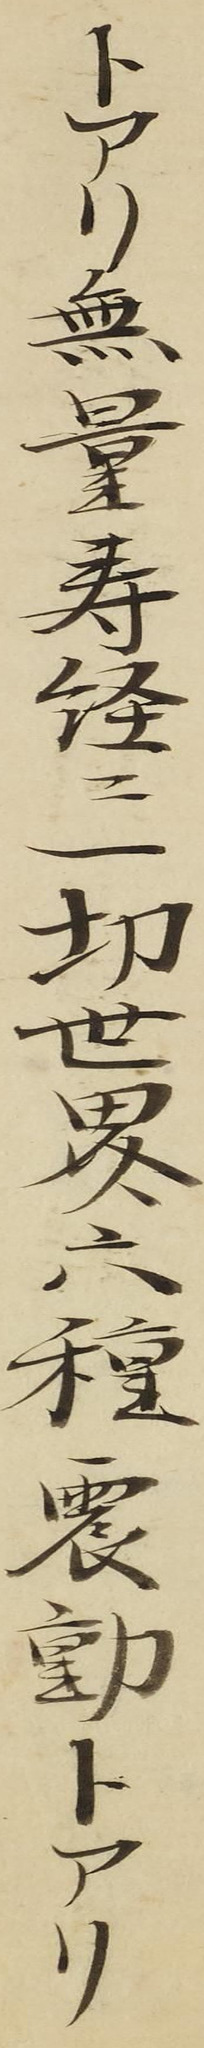トアリ無量寿経ニ一切世界、六種震動トアリ
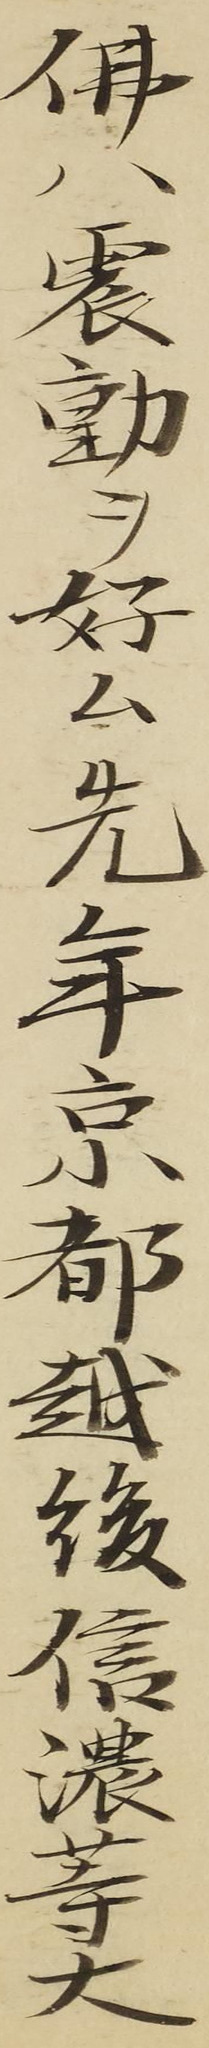仏ハ震動ヲ好ム先年京都越後信濃等大
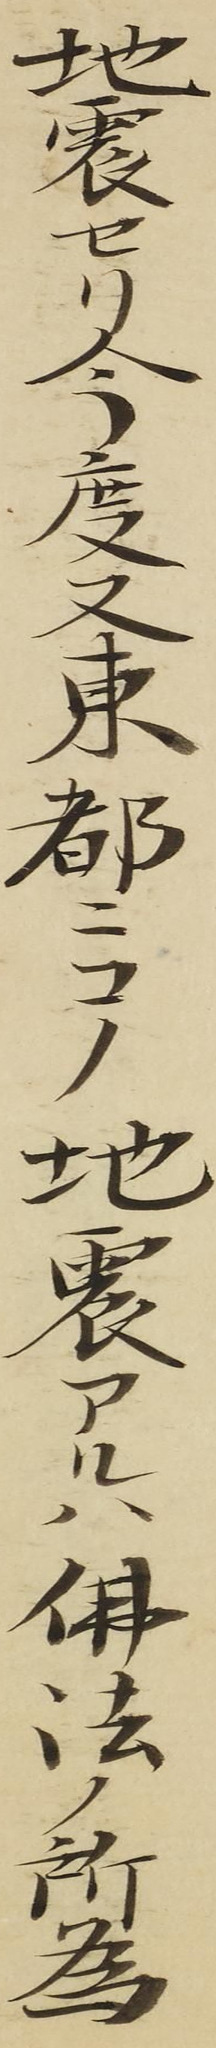地震セリ今度又東都ニコノ地震アルハ仏法ノ所為
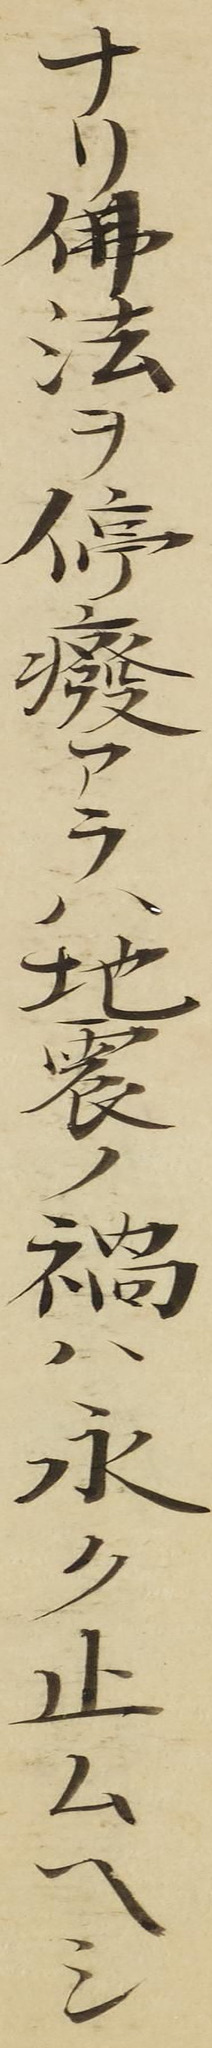ナリ仏法ヲ停廃アラハ地震ノ禍ハ永ク止ムヘシ
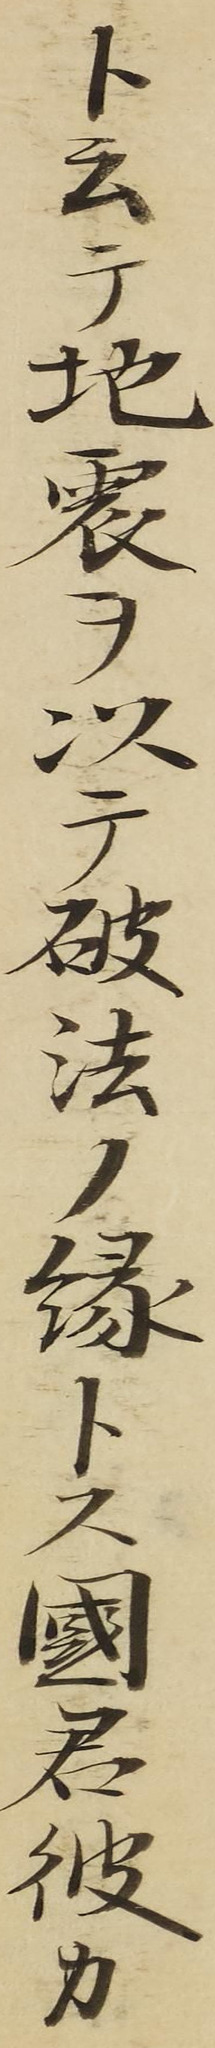ト云テ地震ヲ以テ破法ノ縁トス国君彼カ
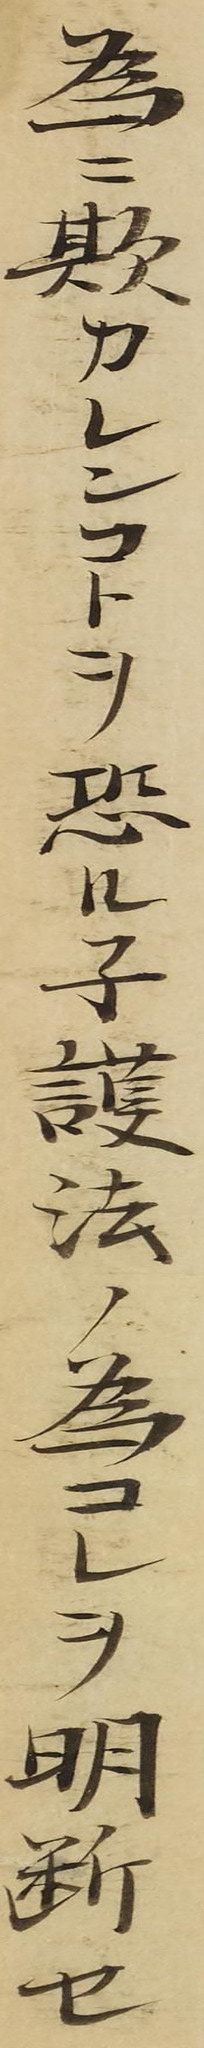為ニ欺カレンコトヲ恐ル子護法ノ為コレヲ明断セ

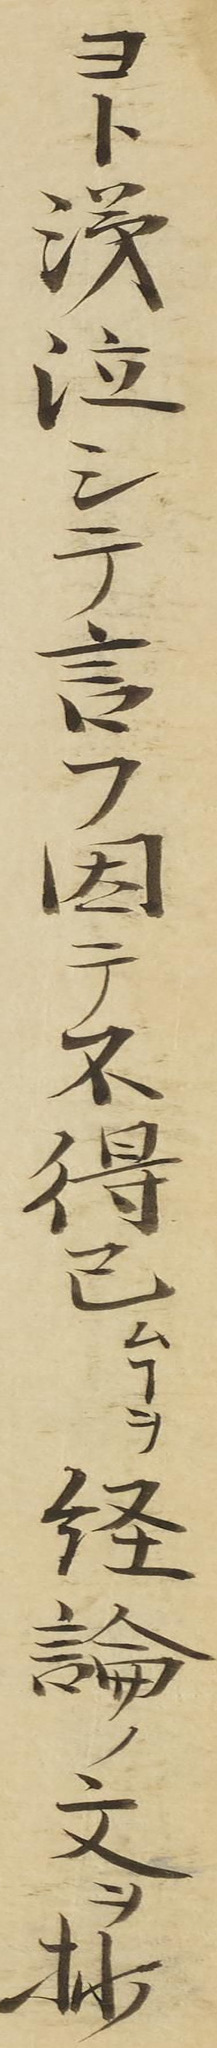ヨト涕泣シテ言フ因テ不得已ムコトヲ経論ノ文ヲ抄
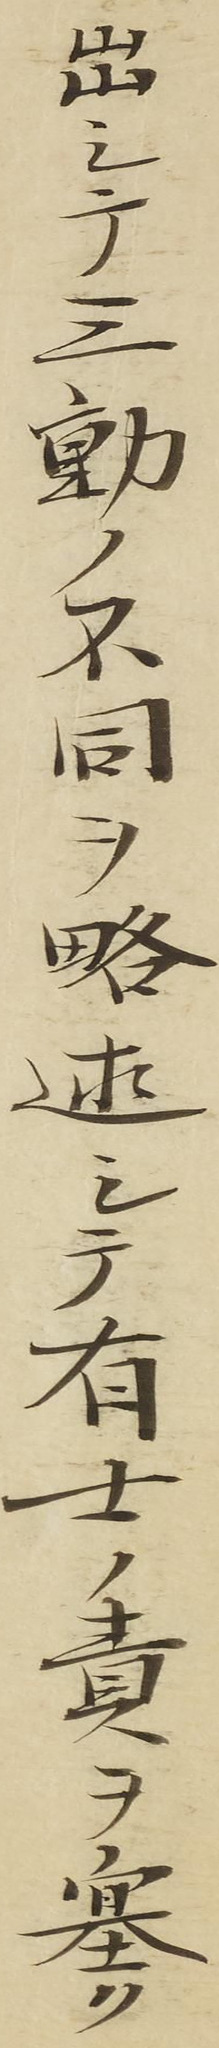出シテ三動ノ不同ヲ略述シテ有士ノ責ヲ塞ク
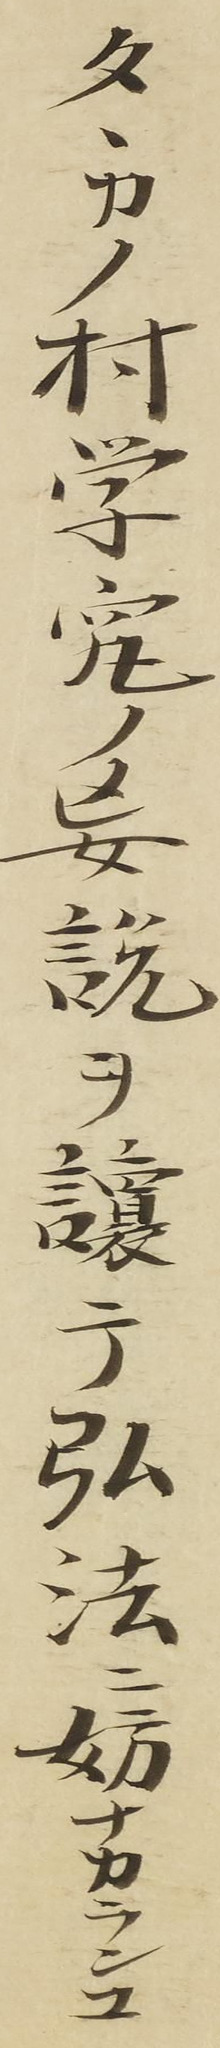タヽカノ村学究ノ妄説ヲ譲テ弘法ニ妨ナカランコ
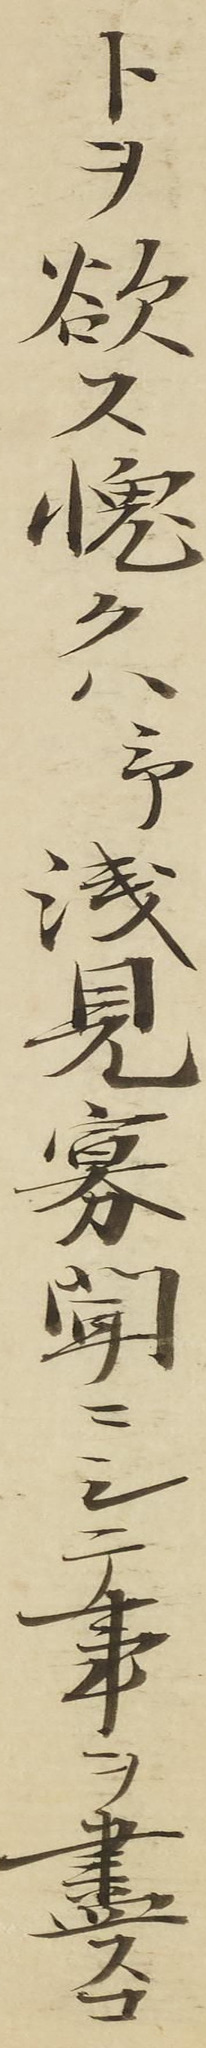トヲ欲ス愧クハ予浅見寡聞ニシテ事ヲ尽スコ
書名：地震説　鶴高山善仁寺天柗老人著述　全
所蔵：東京大学地震研究所図書室 Earthquake Research Institute Library, The University of Tokyo, JAPAN
